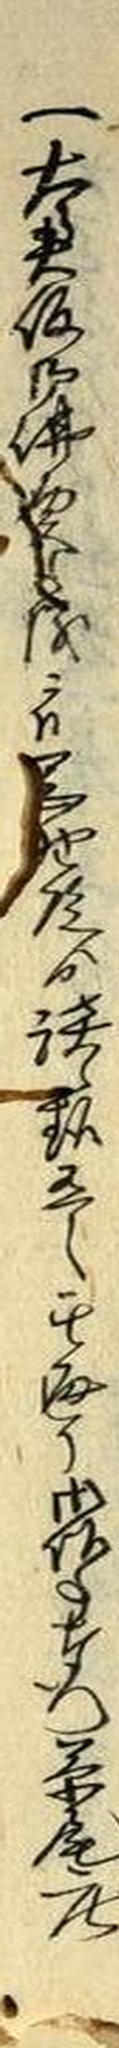一大奥仮御仏殿之儀ニ付岡野殿ゟ談之趣有之其通り御作事奉行草尾庄
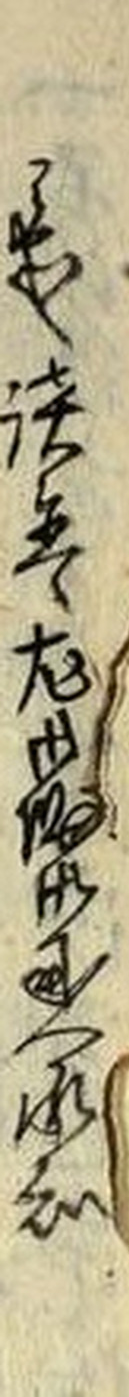兵衛へ談置候尤御側御用人承知
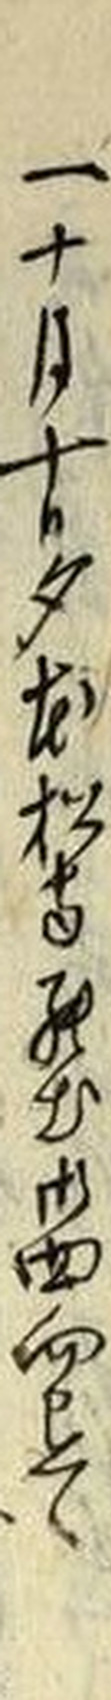一十月十日夕本松寺罷出御回向申上候
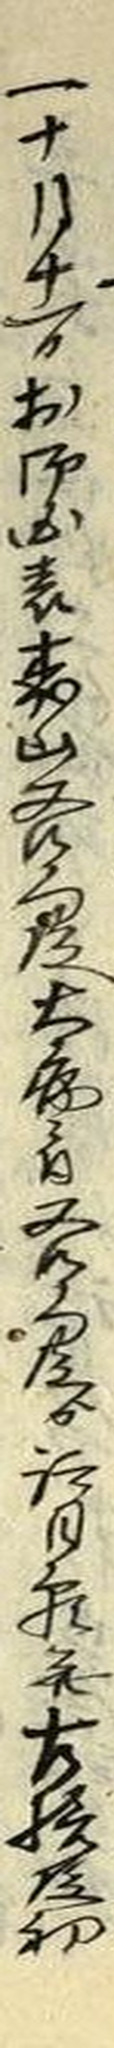一十月十一日於御国表森山又左衛門殿大病ニ付又左衛門殿ゟ跡目願并左膳殿初
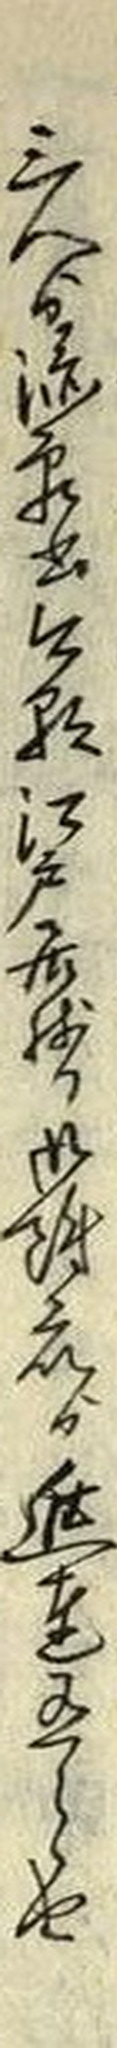三人ゟ添願書今朝江戸居残り御附衆ゟ進達有之由
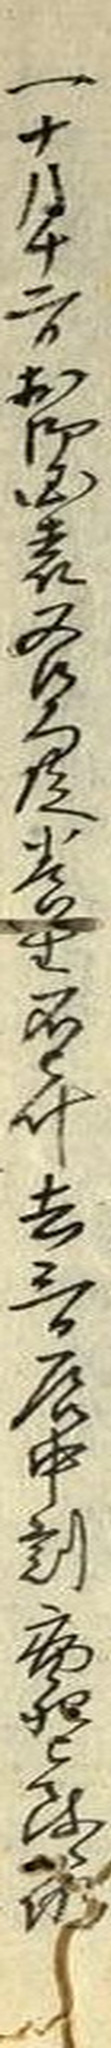一十月十二日於御国表又左衛門殿養生不被叶去三日辰中刻病死被致仍
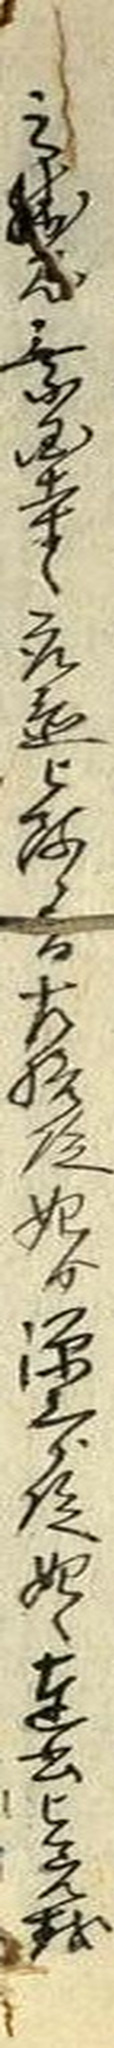之勝見乗国寺へ取置被致候旨左膳殿始ゟ源三郎殿始へ達書被差越
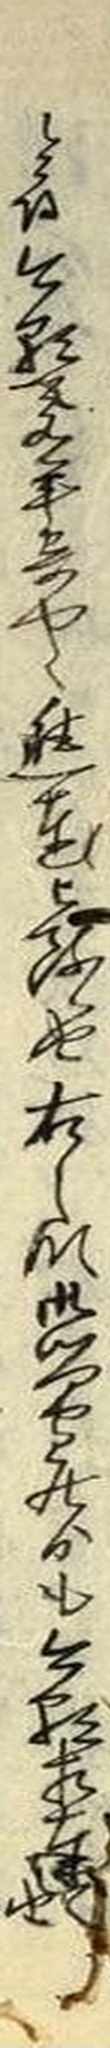候ニ付今朝若年寄中へ進達被致候由右之段御留守居ゟも今朝相達候由
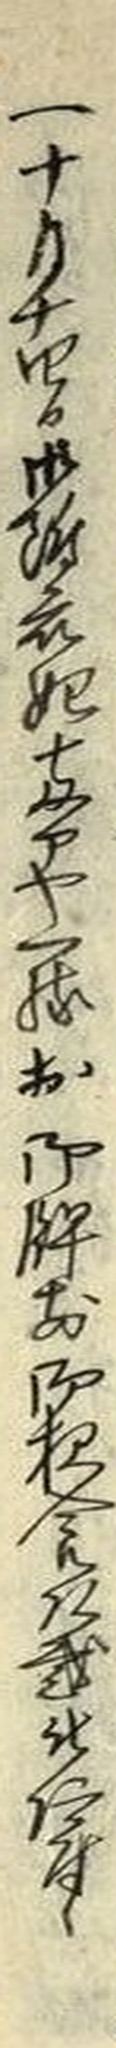一十月十四日御附衆始両部や一統於御牌前御夜食頂戴被仰付候
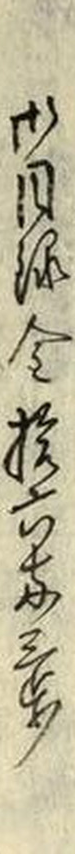御目録金拾六両三歩
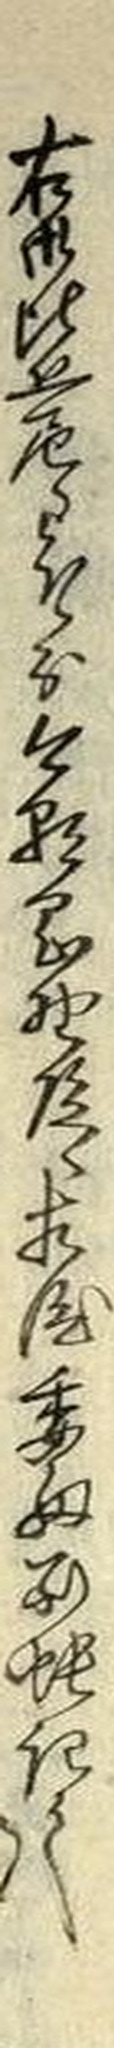右御比丘尼被下候分今朝岡野殿へ相渡委細別帳記之
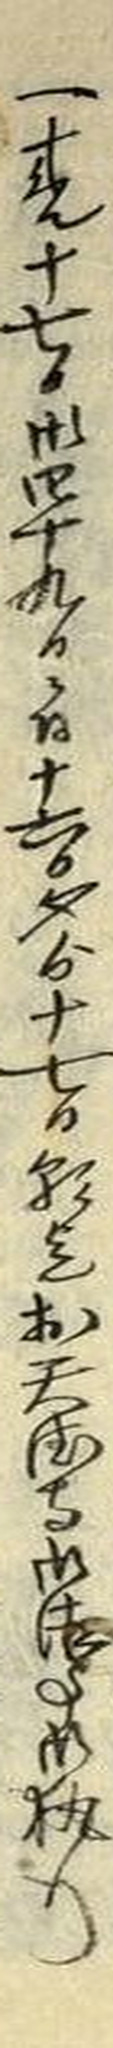一来ㇽ十七日御四十九日ニ付十六日夕ゟ十七日朝迄於天徳寺御法事御執行
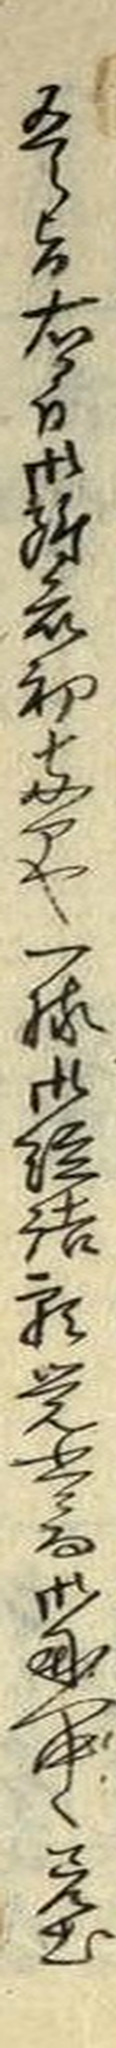有之旨右ニ付御附衆初両部や一統御経詰願覚書ニ而御用人中へ差出
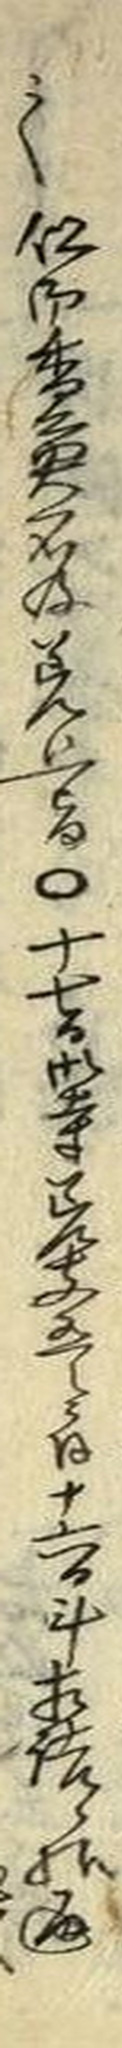之但御香奠不及差上候旨○十七日御寺差支有之候ニ付十六日斗相詰候様通有之
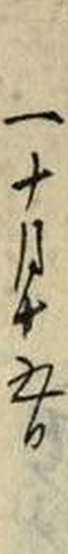一十月十五日

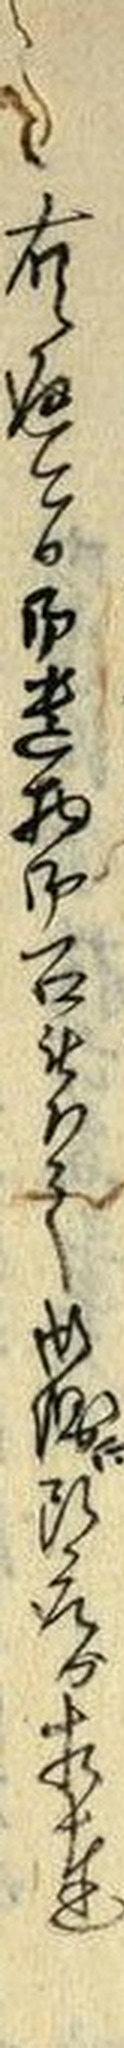右之通今日御遣物御召被下之御側向頭取ゟ相達
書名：少傅日録抄（斉善付側向頭取日記、江戸并道中、初入在国、逝去後…
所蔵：福井県文書館 Fukui Prefectural Archives
